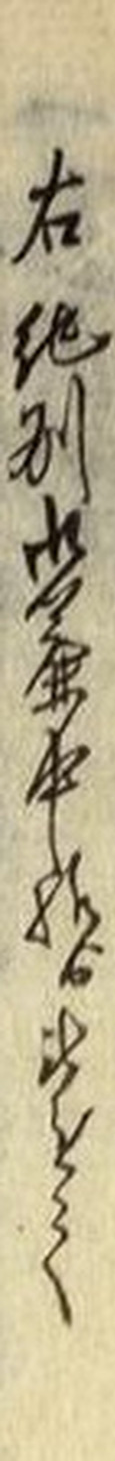右紀州御簾中様ゟ被進之
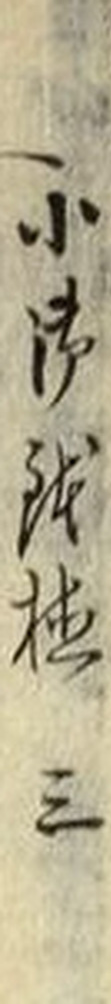小御鉢植三
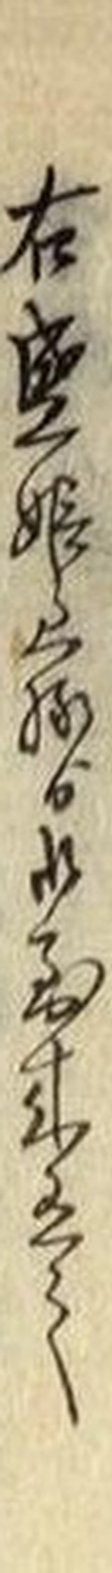右盛姫君様ゟ御到来有之
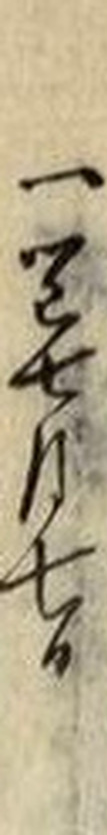一閏七月七日
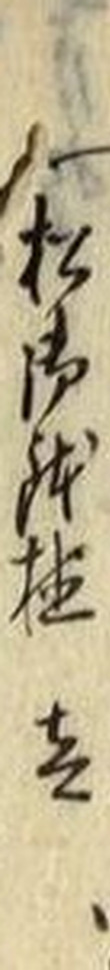小御鉢植三
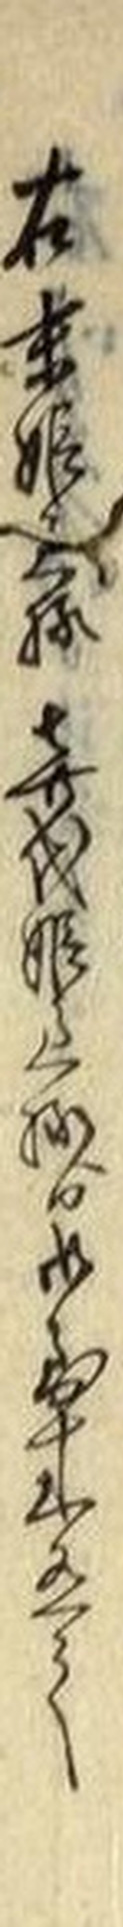右末姫君様喜代姫君様ゟ御到来有之
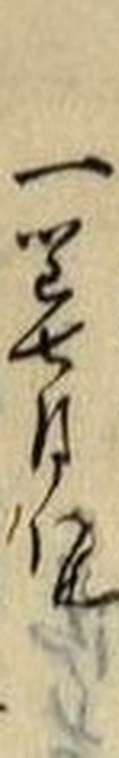一閏七月五日
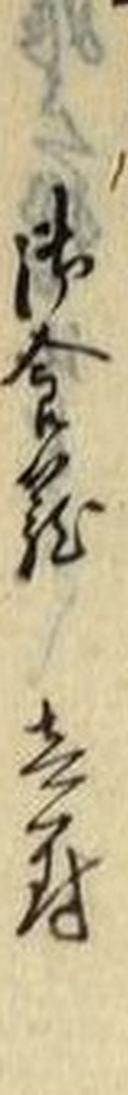御食籠壱対

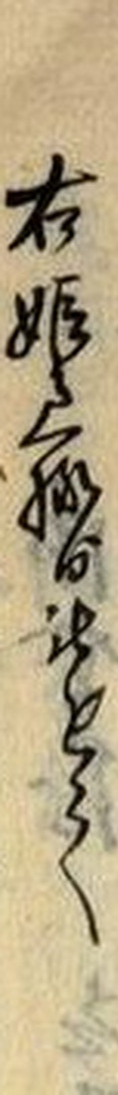右姫君様ゟ被進之
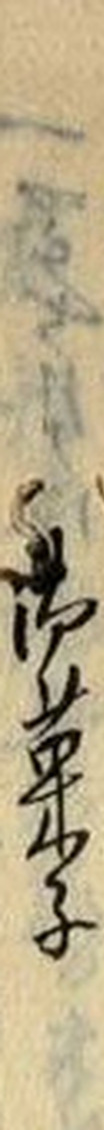御菓子
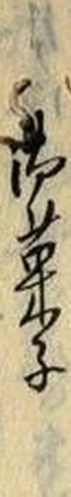御菓子
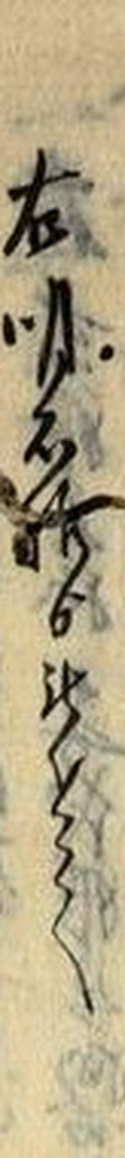右明石様ゟ被進之
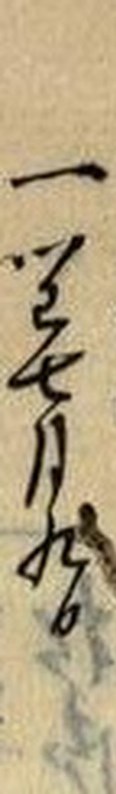一閏七月九日
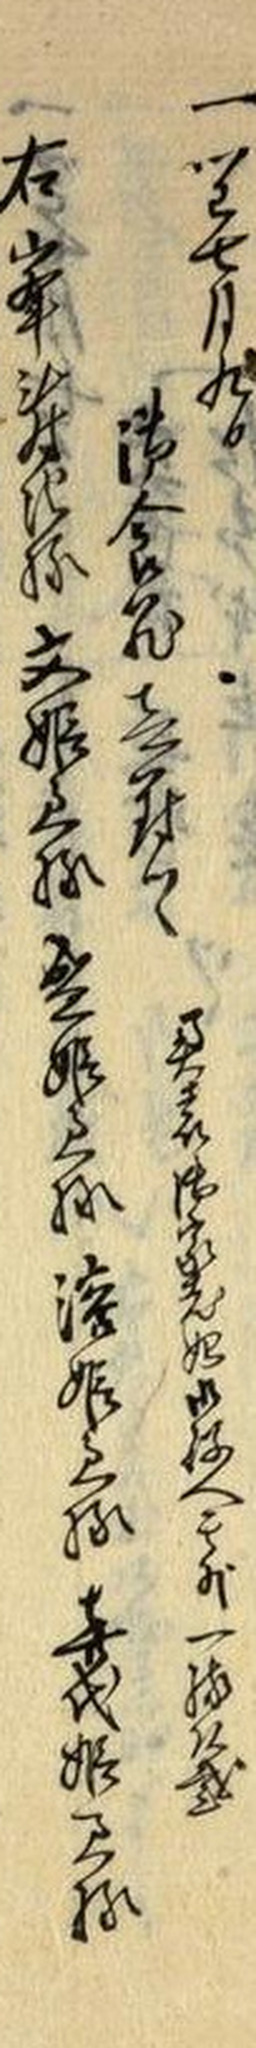右峰寿院様文姫君様盛姫君様溶姫君様喜代姫君様
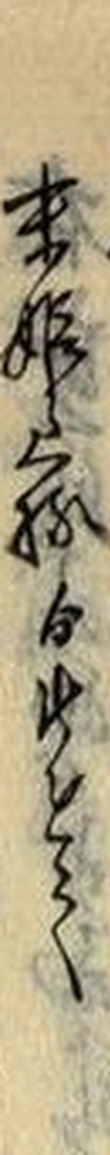末姫君様ゟ被進之
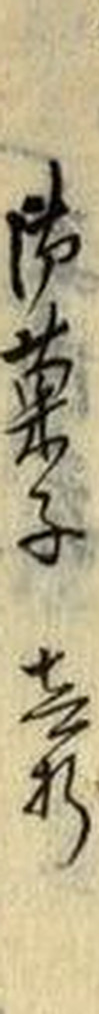御菓子壱折
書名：少傅日録抄（斉承付側向頭取日記、在府）
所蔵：福井県文書館 Fukui Prefectural Archives
